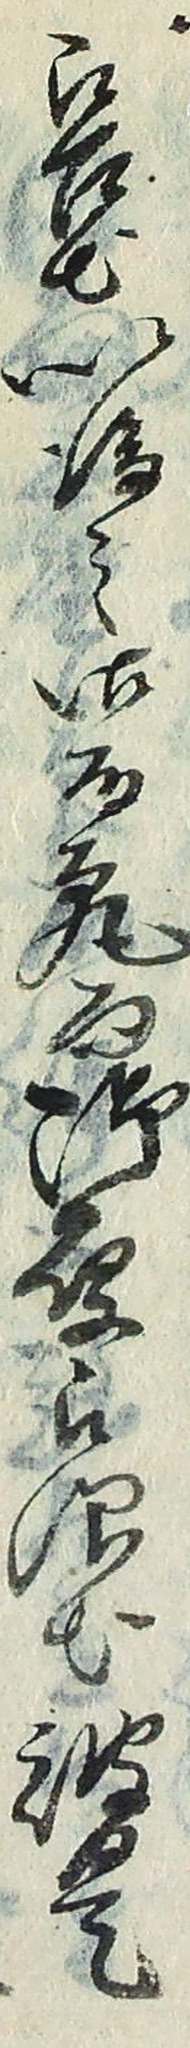被召出以後之御取究向御厚被仰出彼是
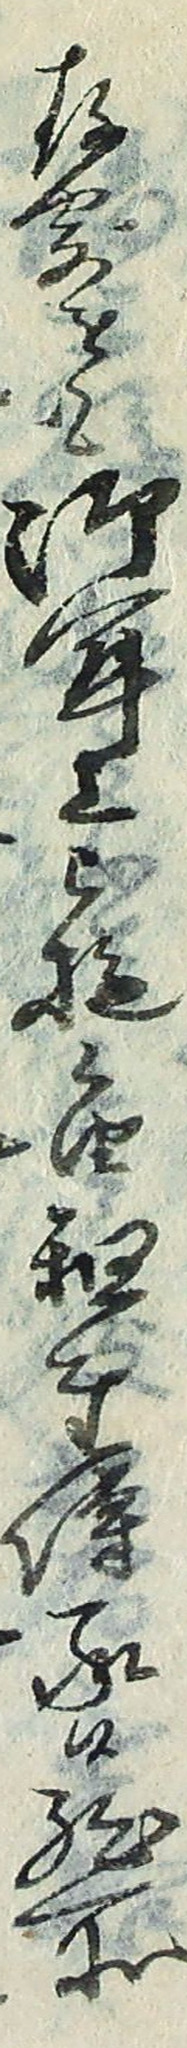存寄をも御聞上被遊候由粗奉伝承候然処
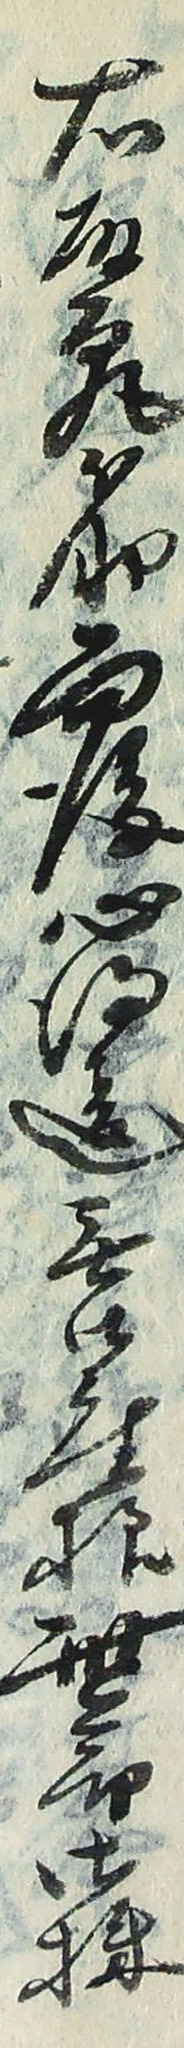右取究筋向後心得違無御座様此節御株
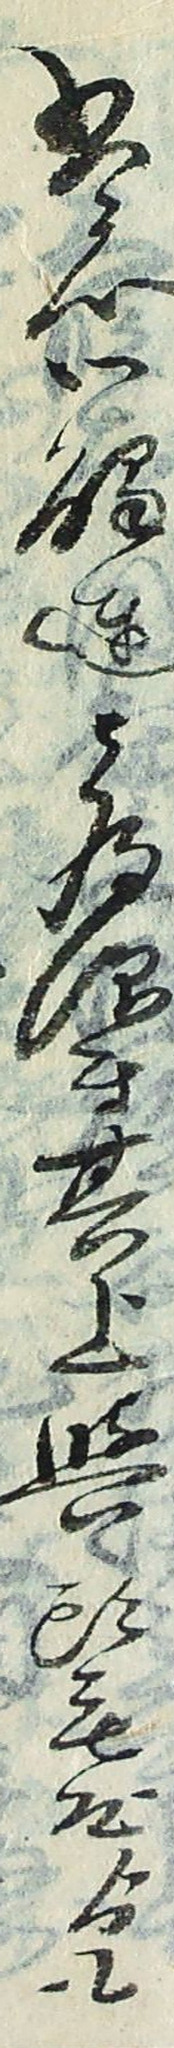書を以御触達被為仰付其上与頭庄屋ゟも
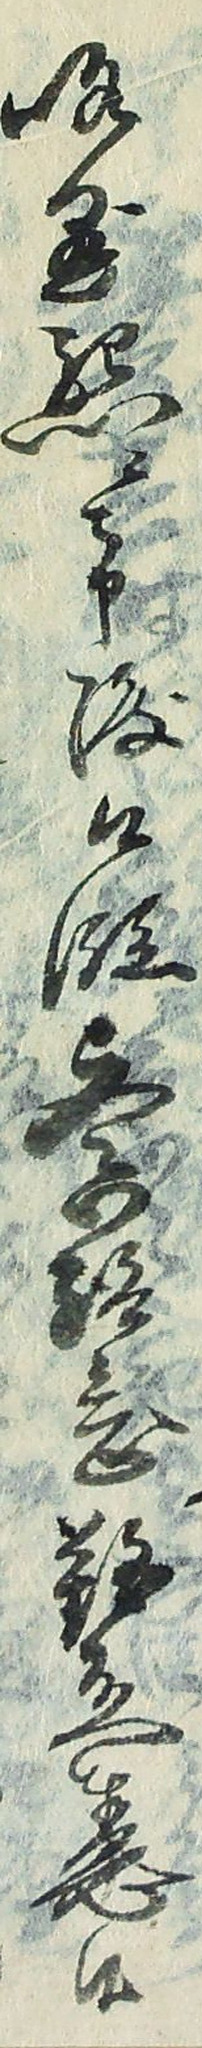呼懸懇に被申渡候段夫々御趣意難有奉畏候
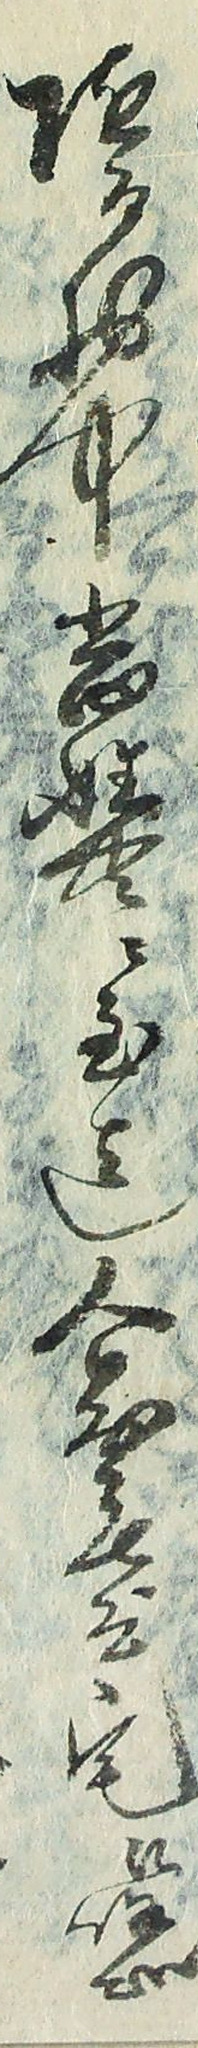随而村中小百姓共に至迄人別庄屋宅江呼出
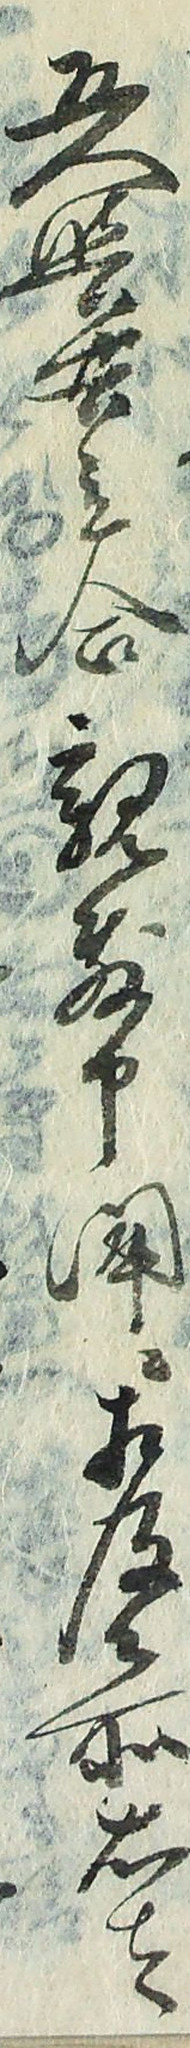五人与共立合親敷申聞に相及候所右は
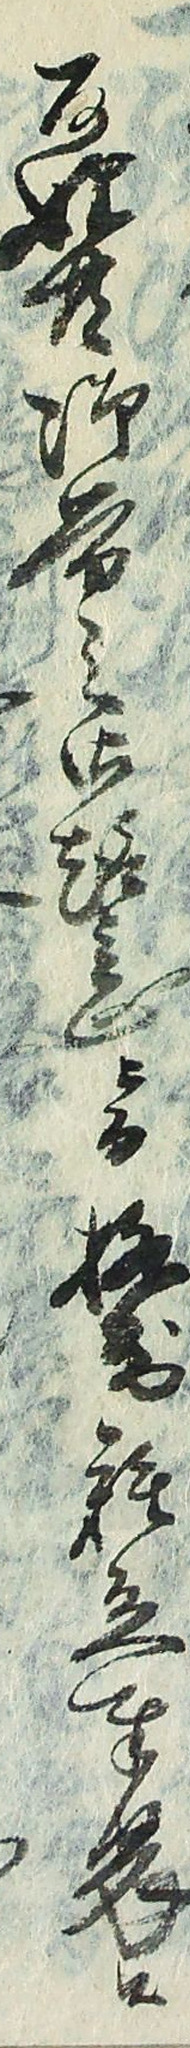百姓共御労之御趣意に而格別難有奉畏候
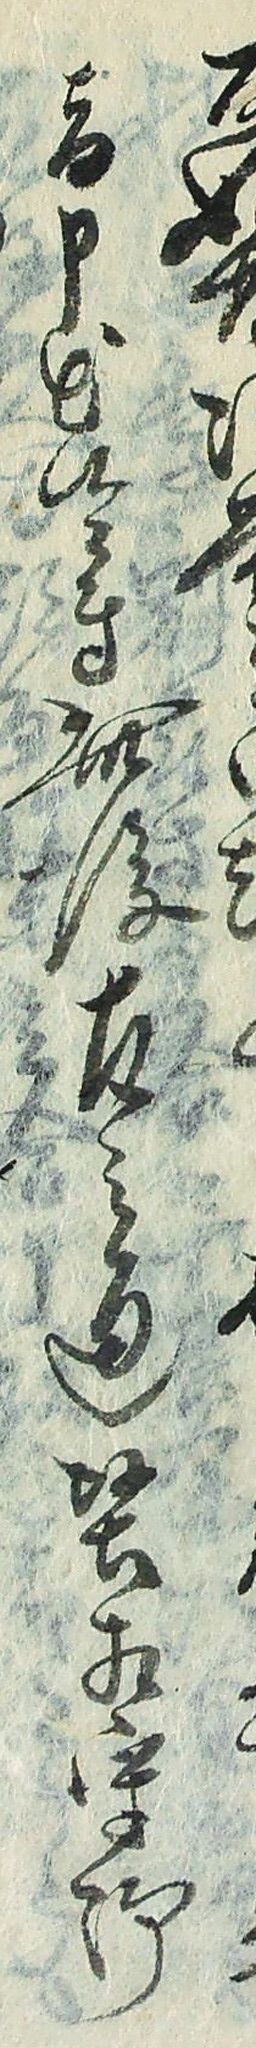旨申出候に付此後左之通堅相守御
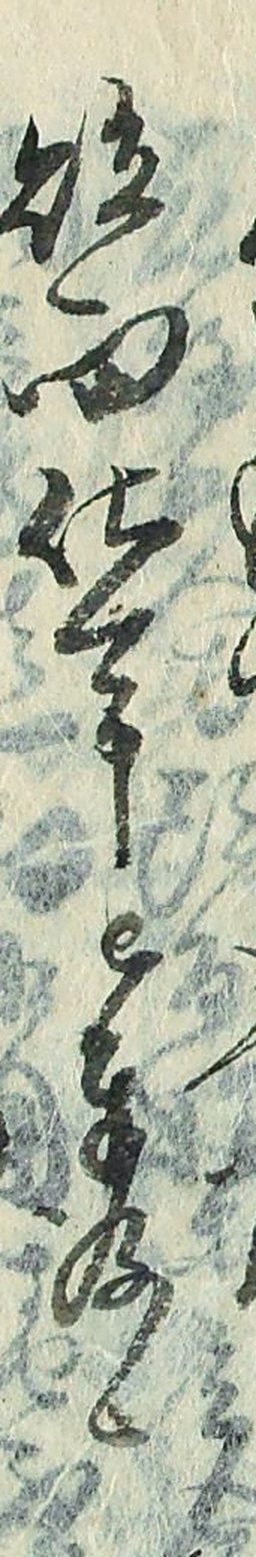賄向仕可申と奉候
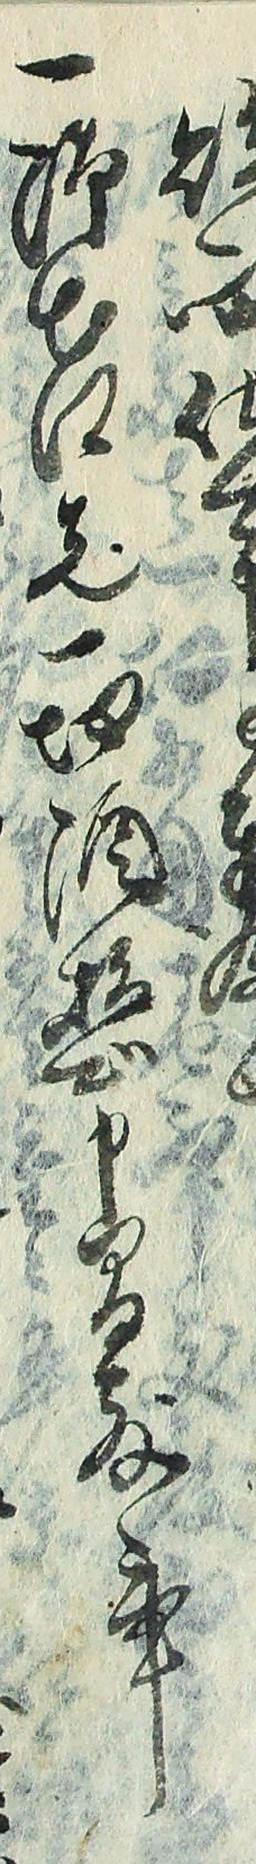一御出郷先一切酒指出申間敷候事
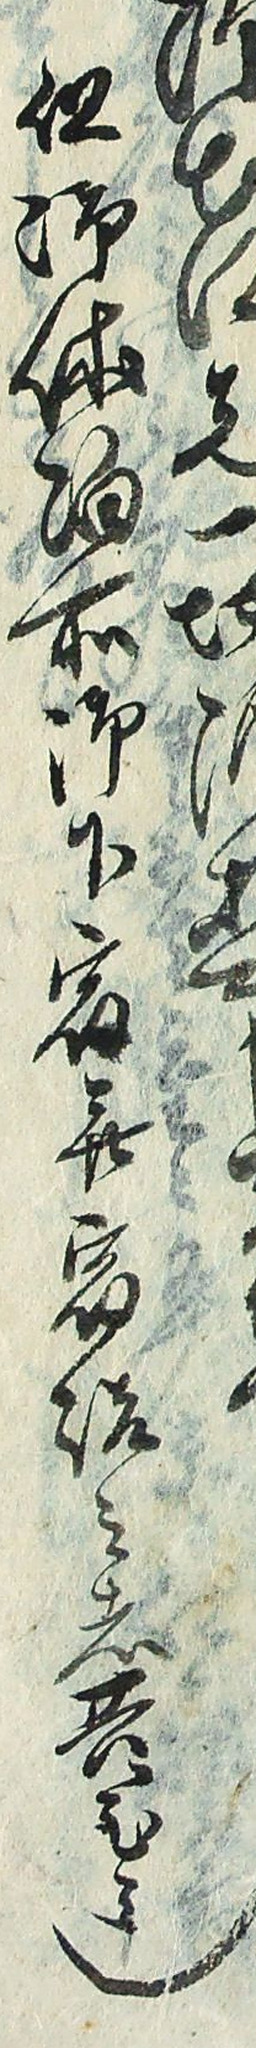但御休泊所御下宿幷宿詰之者共へ至迄

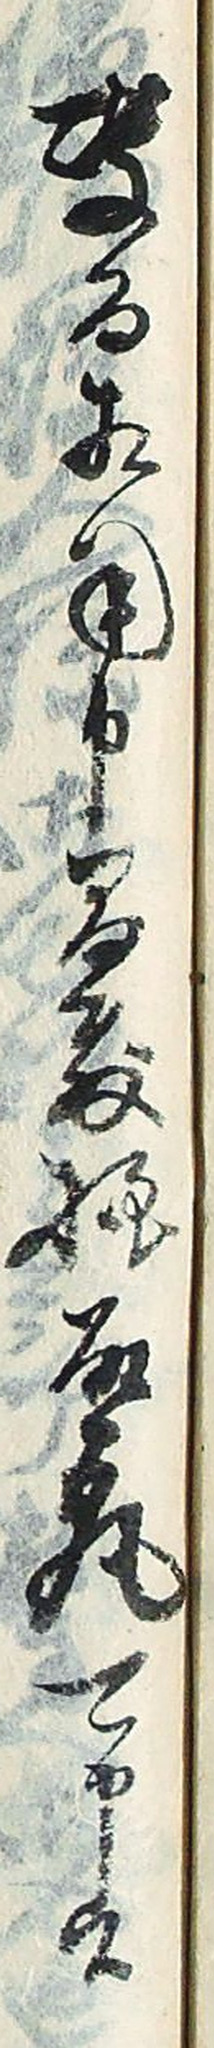決而相用申間敷様取究可申候
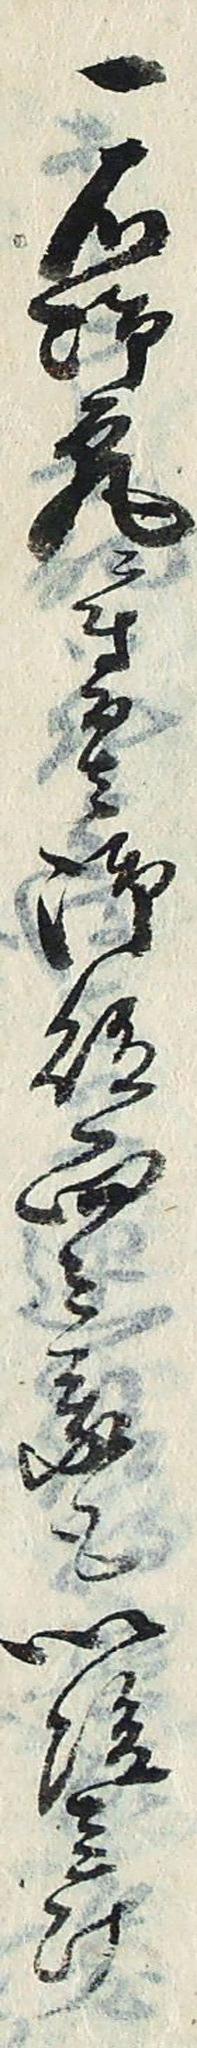一右御取究に付而は御役向之義も以後壱汁
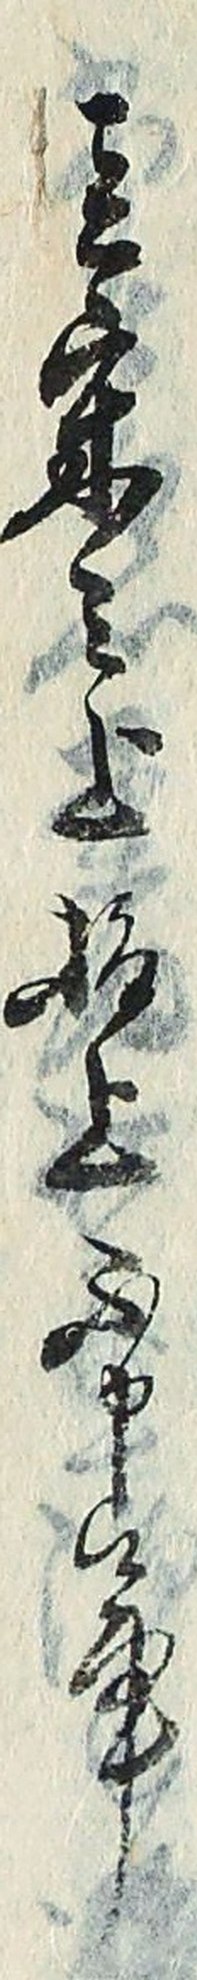壱菜之上指上不申候事
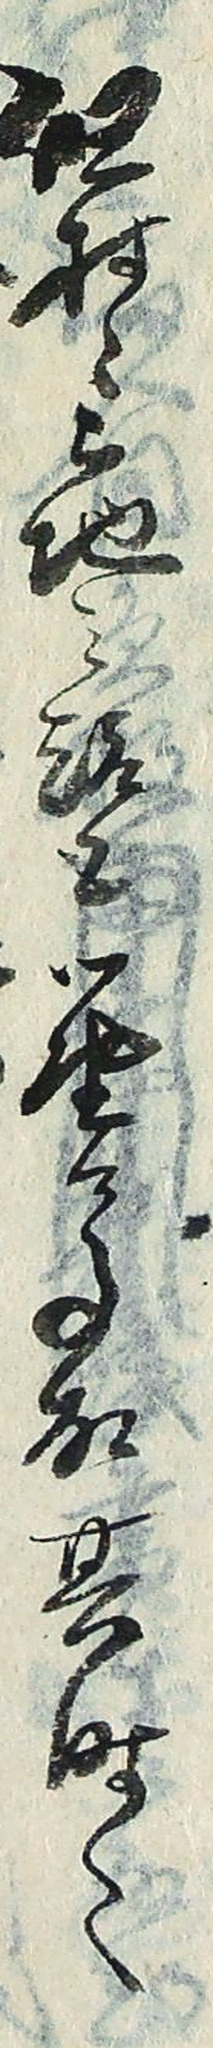但村々土地之趣も御坐候事故其時々
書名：諸御用御□受書控
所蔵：鳴門教育大学 Naruto University of Education
